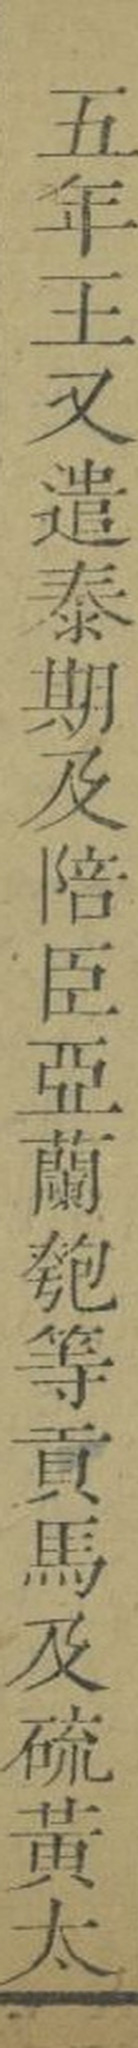五年王又遣泰期及陪臣亜蘭匏等貢馬及硫黄太
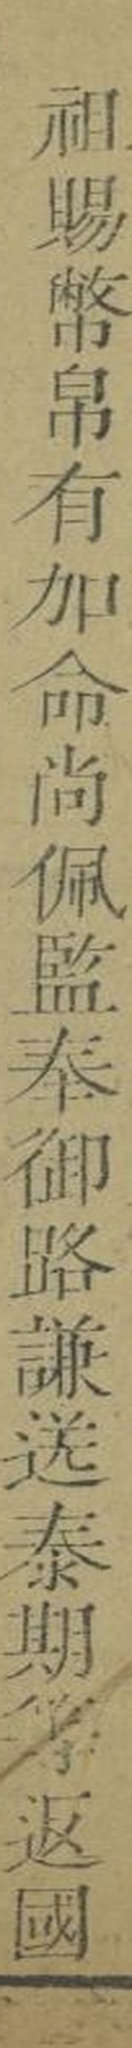祖賜幣帛有加命尚佩監奉御路謙送泰期等返国
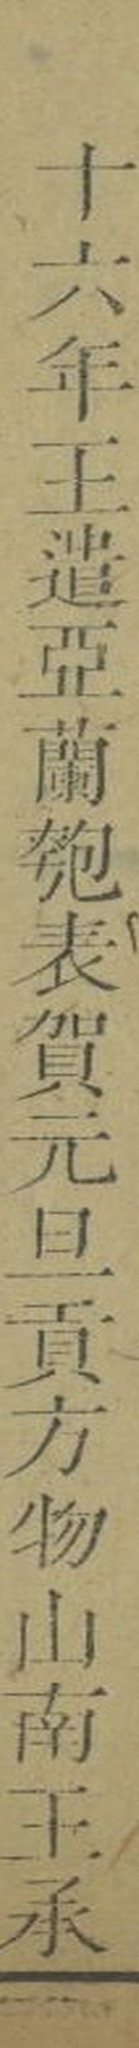十六年王遣亜蘭匏表賀元旦貢方物山南王承
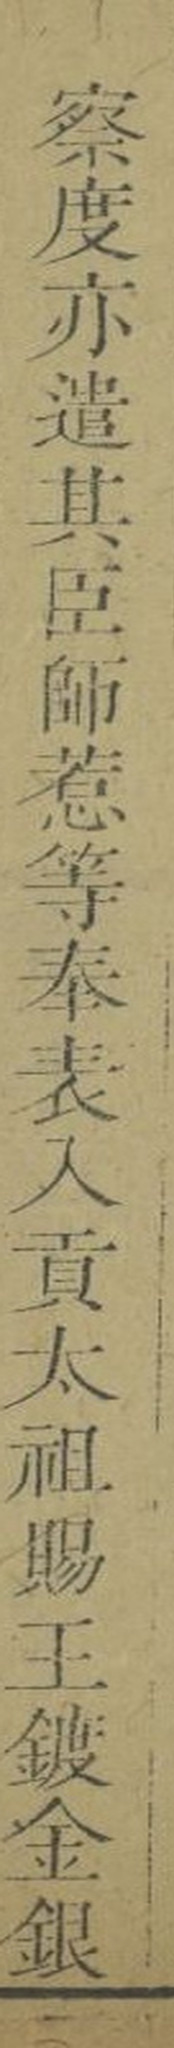察度亦遣其臣師惹等奉表入貢太祖賜王鍍金銀
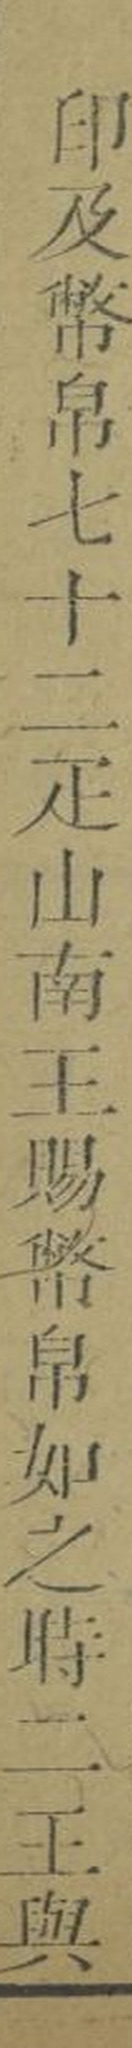印及幣帛七十二疋山南王賜幣帛如之時二王与
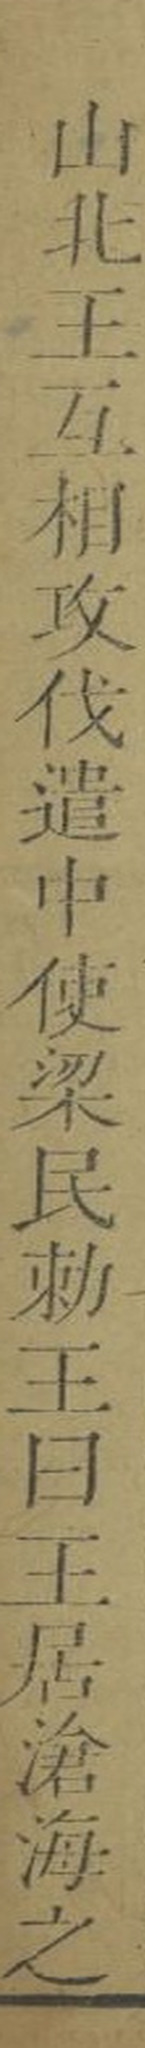山北王互相攻伐遣中使梁民勅王曰王居滄海之

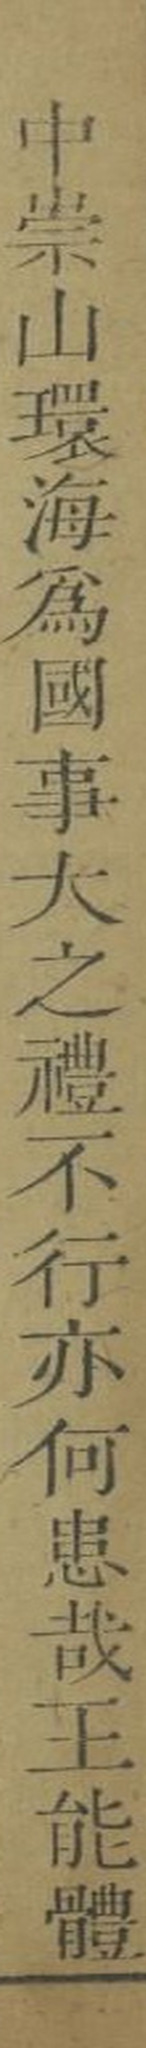中崇山環海為国事大之礼不行亦何患哉王能体
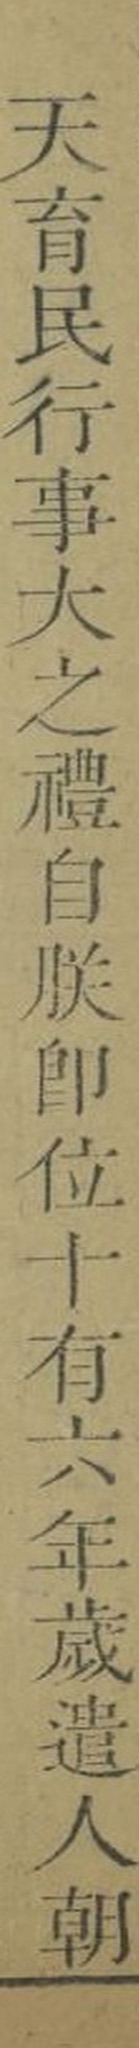天育民行事大之礼自朕即位十有六年歳遣人朝
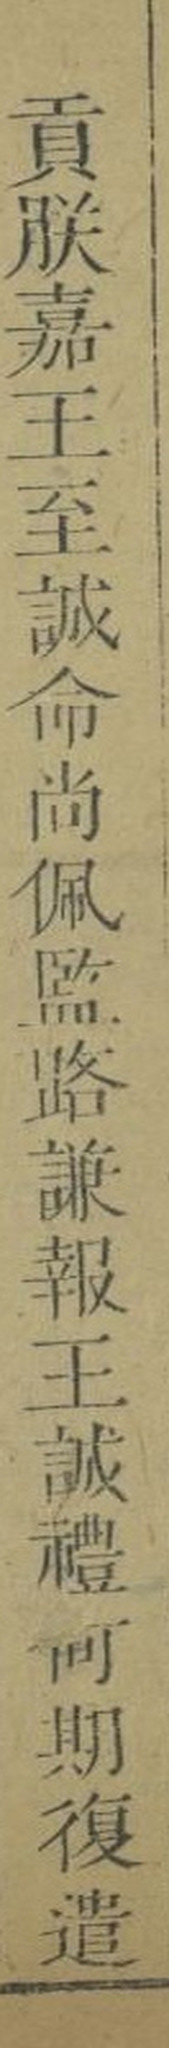貢朕嘉王至誠命尚佩監路謙報王誠礼何期復遣
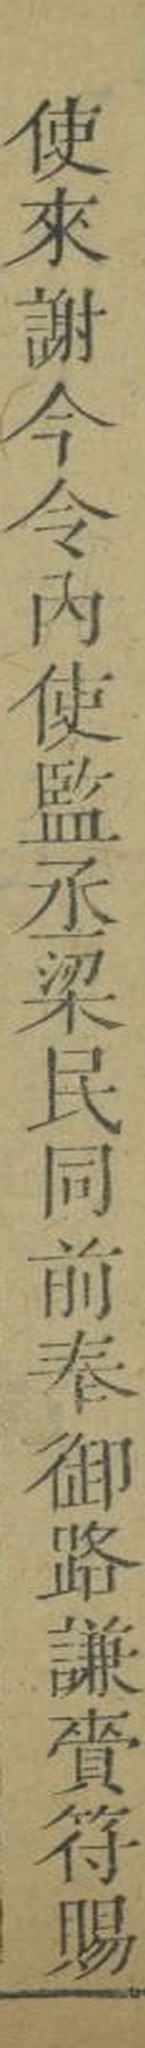使来謝今令内使監丞梁民同前奉御路謙賚符賜
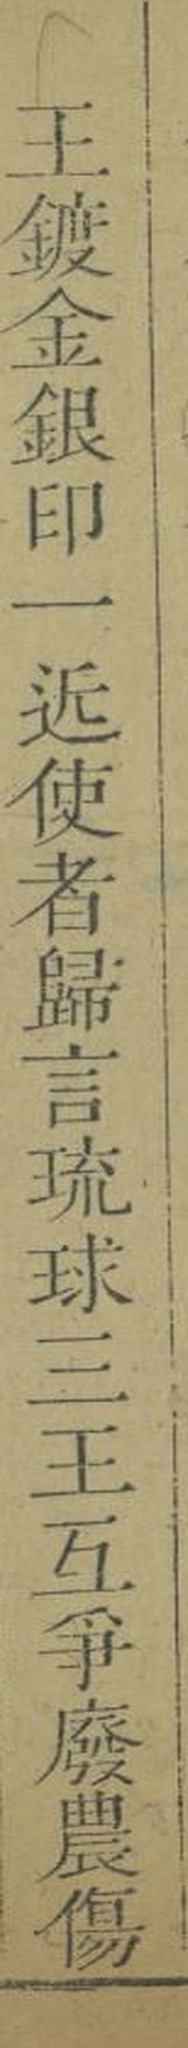王鍍金銀印一近使者帰言琉球三王互争廃農傷
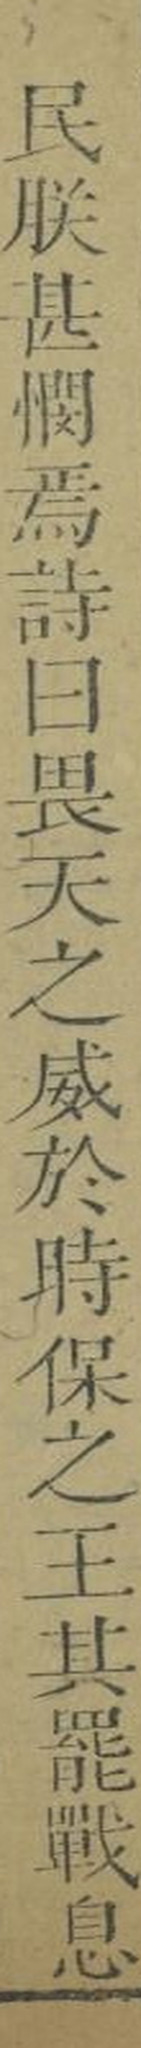民朕甚憫焉詩曰畏天之威於時保之王其罷戦息
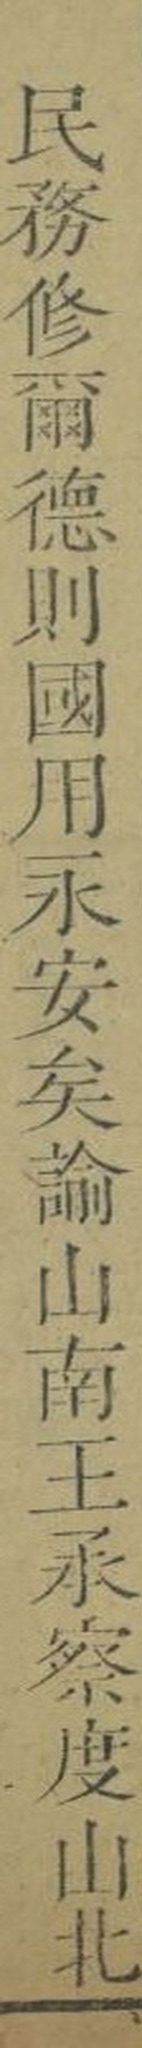民務修爾徳則国用永安矣諭山南王承察度山北
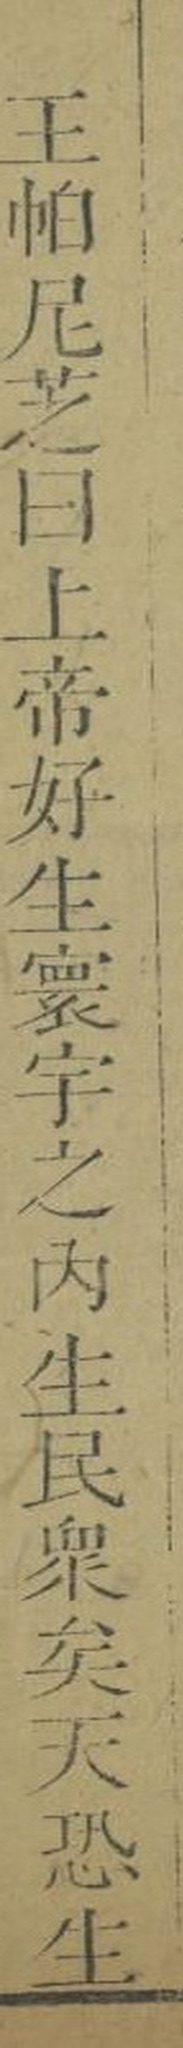王帕尼芝曰上帝好生寰宇之内生民衆矣天恐生
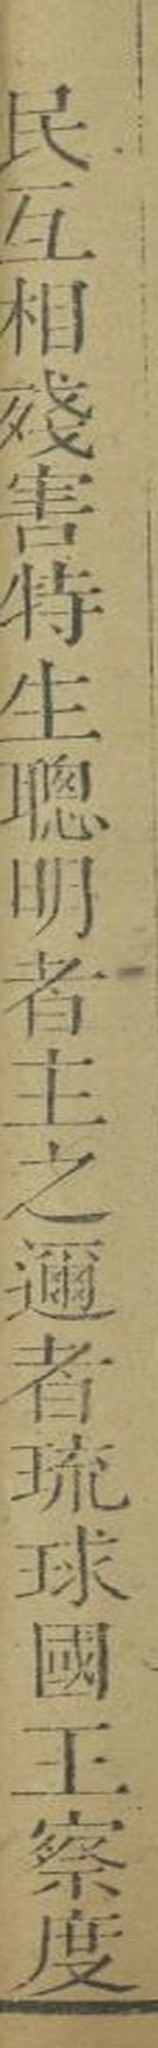民互相残害特生聡明者主之邇者琉球国王察度
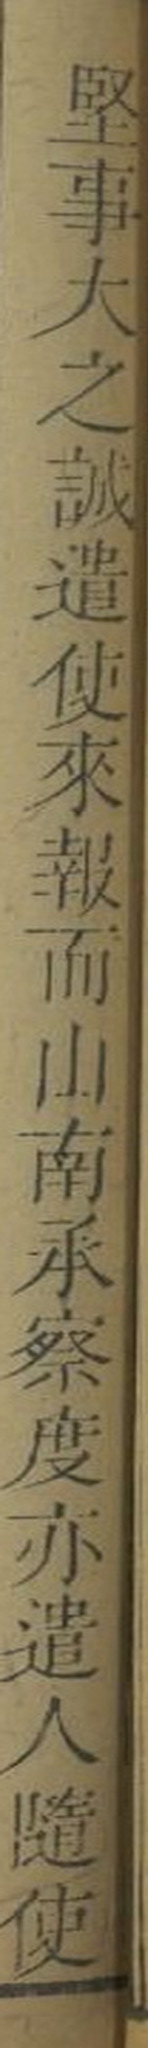堅事大之誠遣使来報而山南承察度亦遣人随使
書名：中山伝信録 巻三
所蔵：University of the Ryukyus Library
